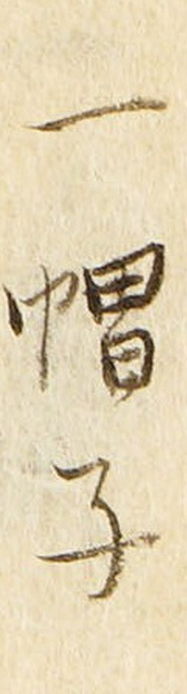一帽子
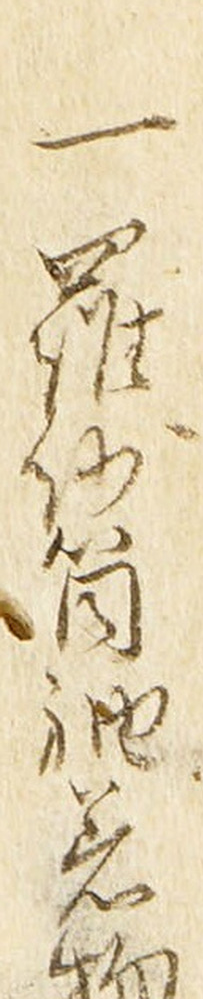一羅紗筒袖着物

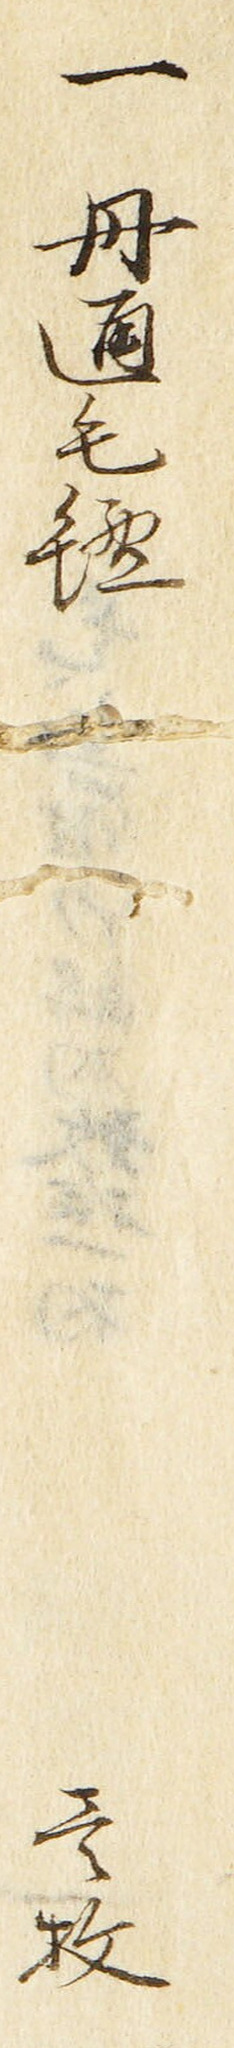一丹通毛氈壱枚
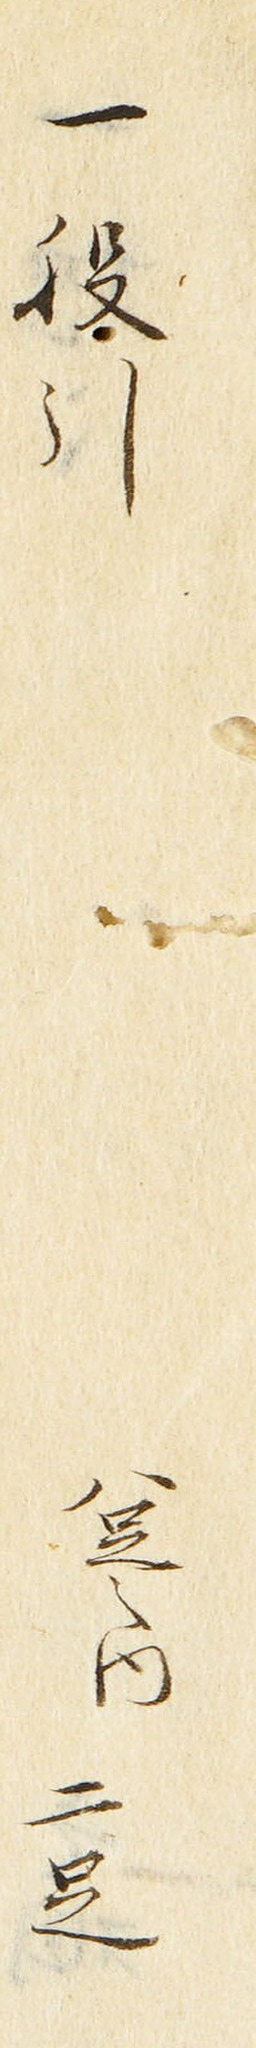一股引八足之内ニ足
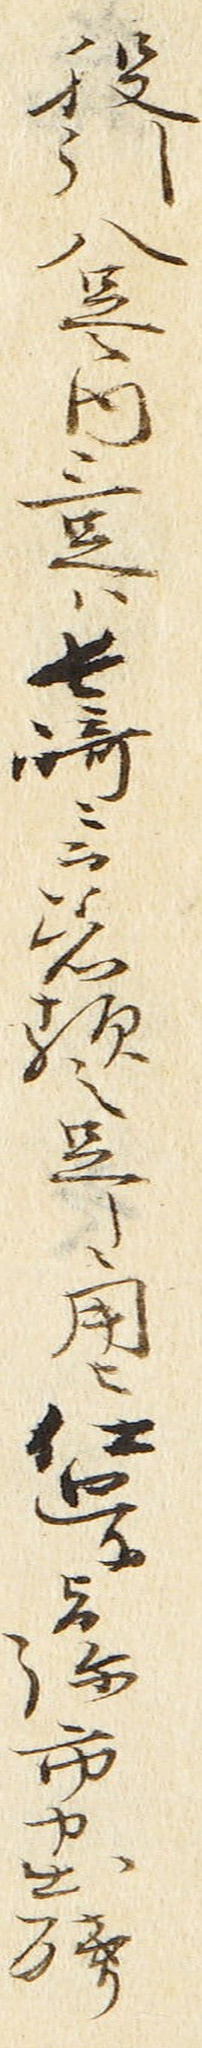股引八足之内三足は長崎に而着類之足しに用ヒ仕廻り旨弥市為出残り
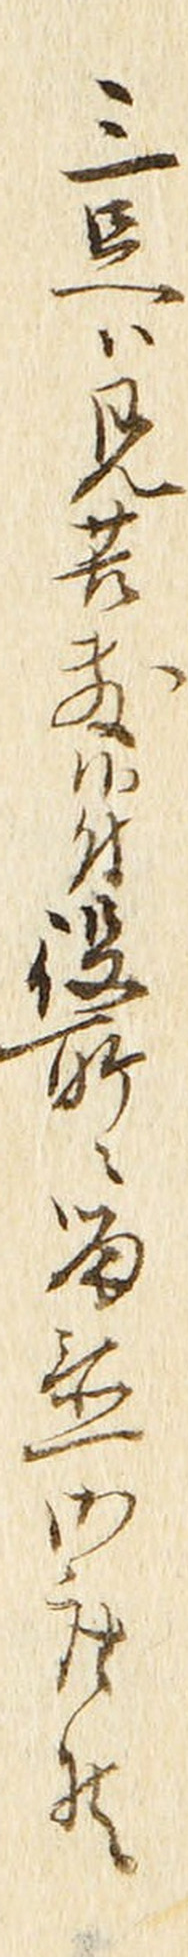三足は見苦敷候付役所に留置御座候
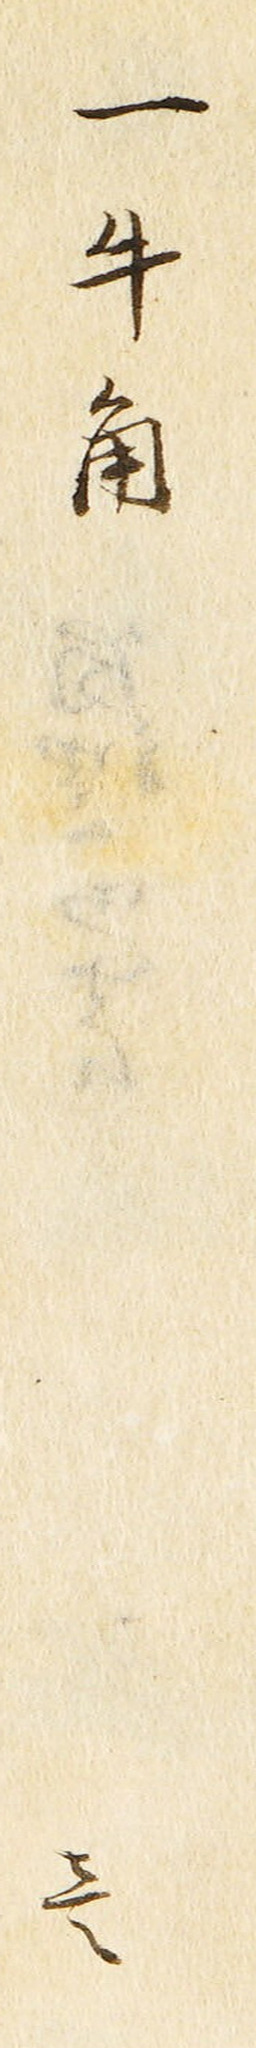一牛角壱
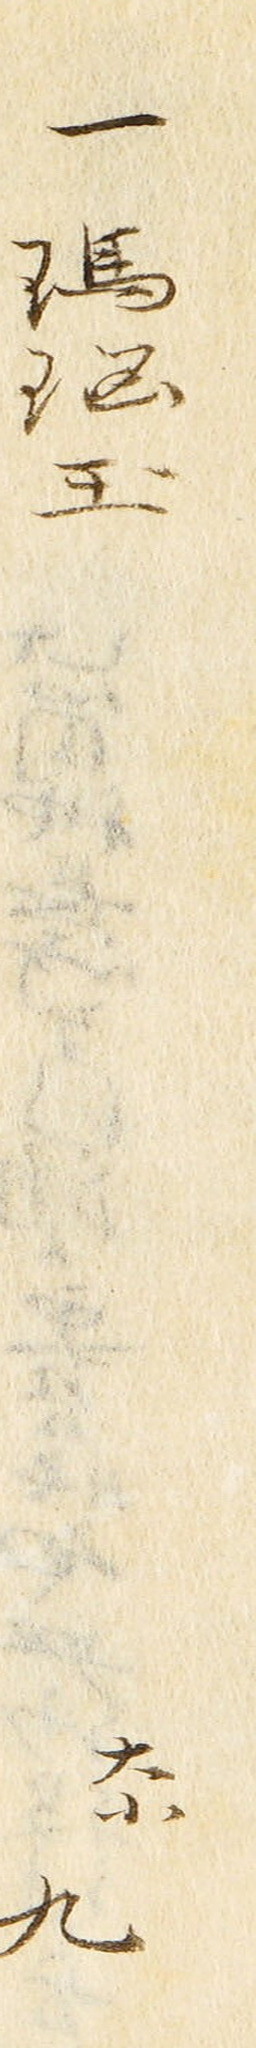一瑪瑙玉大小九
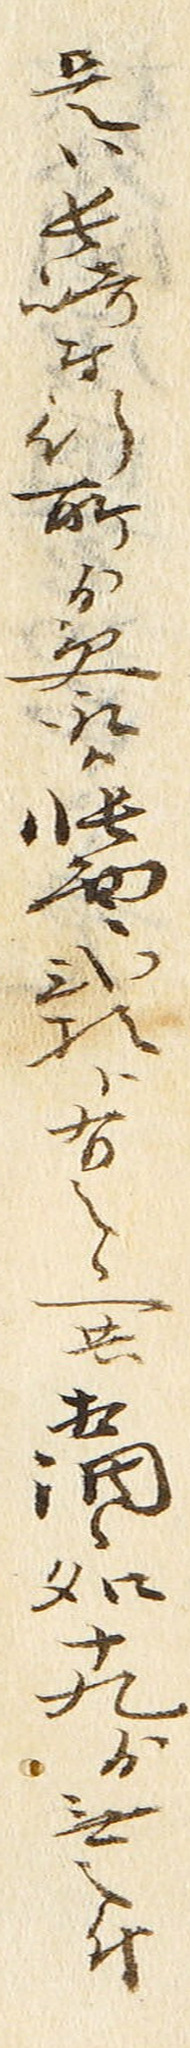是は長崎奉行所ゟ受取候帳面に弐拾と有之候へ共相調候処十九ゟ無之付
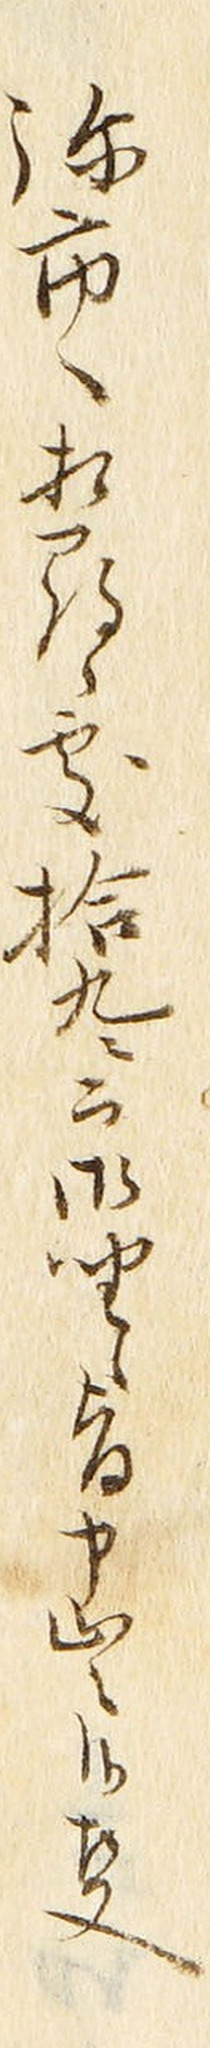弥市へ相罷候處拾九に而御座候旨申出之候事
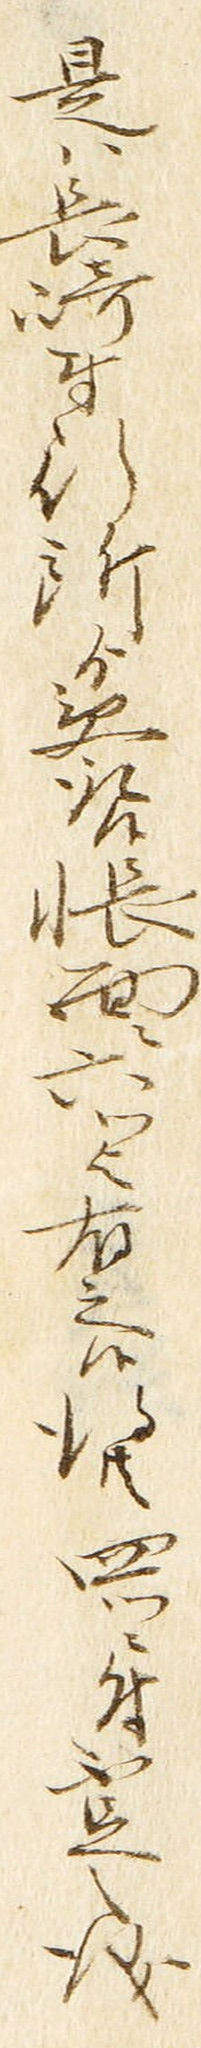是は長崎奉行所ゟ受取候帳面六ツと有之候得共四ツに付不足の儀
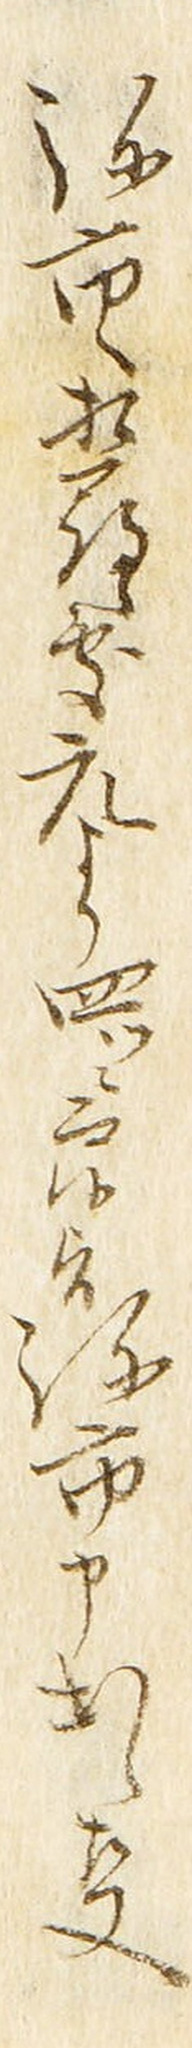弥市へ相罷候處元より四ツに而候旨弥市申出候事
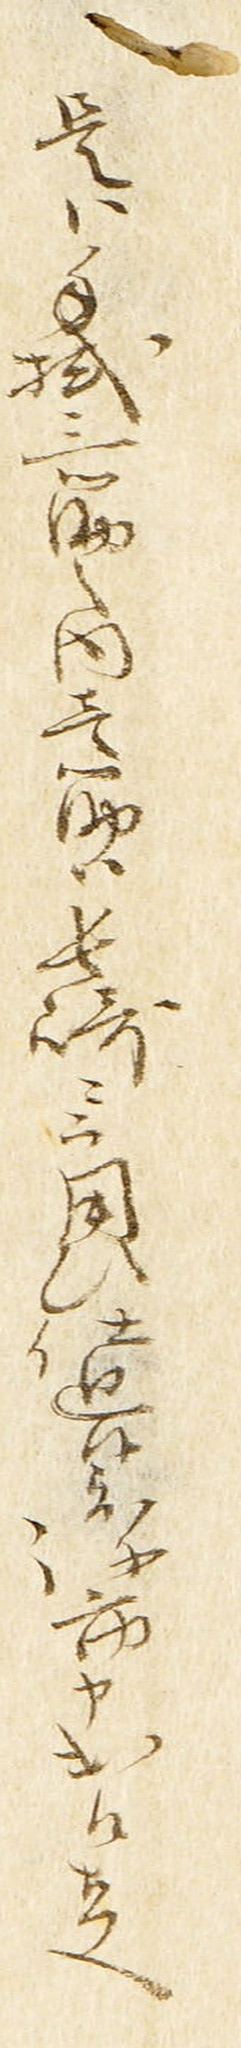是は手拭三筋之内壱筋は長崎に而用ひ仕廻候旨弥市申出候事
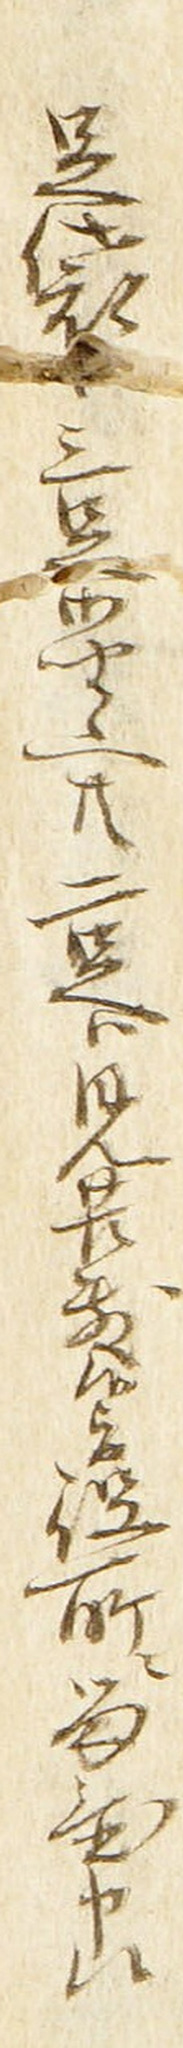足袋三足御座候へ共二足は見苦敷候旨役所に留置申候

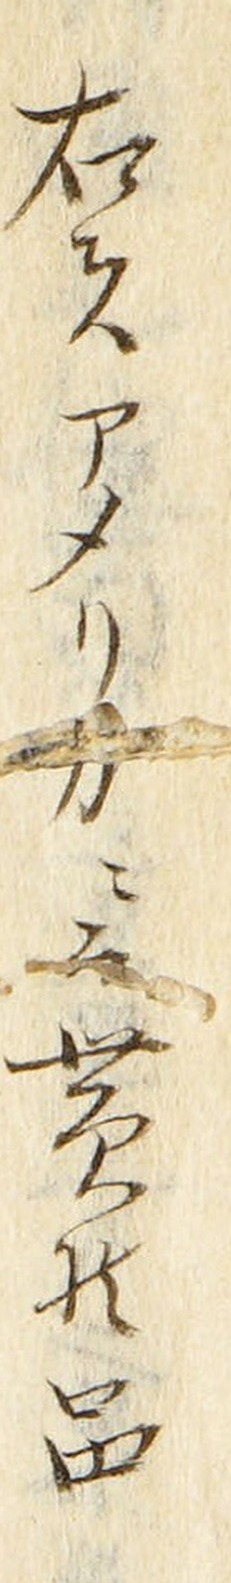右はアメリカに而貰候品
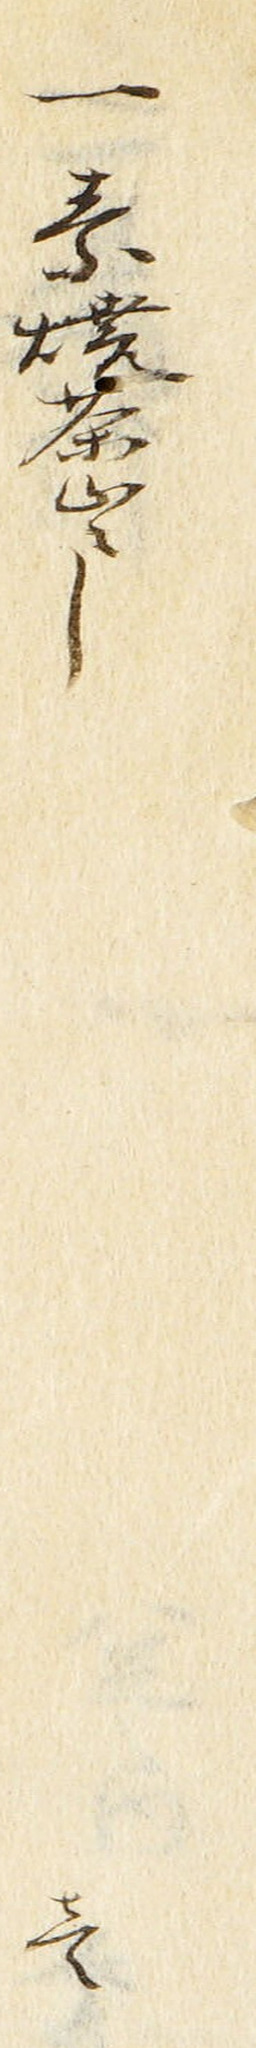一素焼茶山にし壱
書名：長崎漂流記
